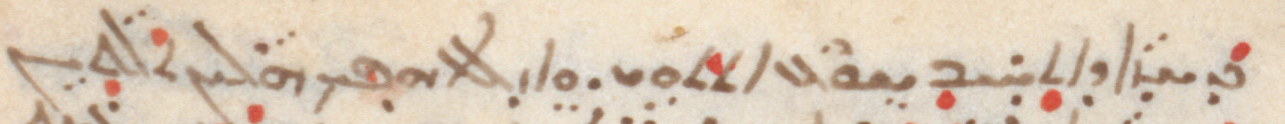ܟܕ ܚܙܐ ܕܐܬܚܝܒ ܝܫܘܥ ܐܬܬܘܝ. ܘܐܙ̣ܠ ܐܗܦܟ ܗܠܝܢ ܬܠܬܝܢ
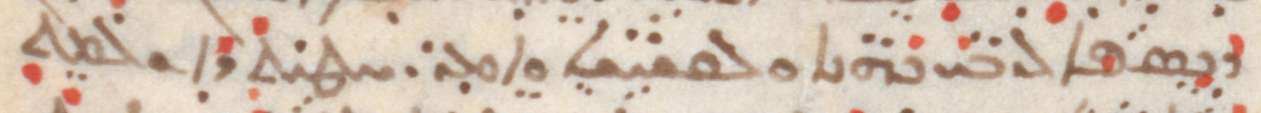ܕܟܣܦܐ ܠܪ̈ܒܝ ܟܗ̈ܢܐ ܘܠܩܫܝ̈ܫܐ ܘܐܡ̣ܪ. ܚܛܝܬ ܕܐܫܠܡܬ
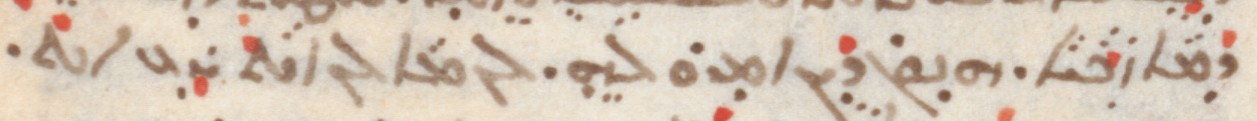ܕܡܐ ܙܟܝܐ. ܗܢܘܢ ܕܝܢ ܐܡ̣ܪܘ ܠܗ. ܠܢ ܡܐ ܠܢ ܐܢܬ ܝ̇ܕܥ ܐܢܬ
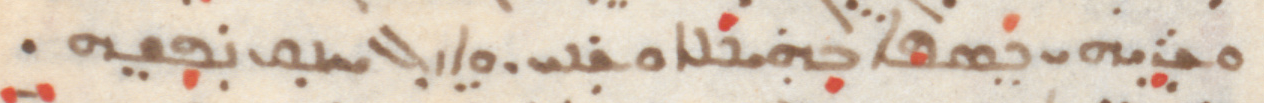ܘܫܕܝܗܝ ܟܣܦܐ ܒܗܝܟܠܐ ܘܫܢܝ. ܘܐܙ̣ܠ ܚܢ̣ܩ ܢܦܫܗ.
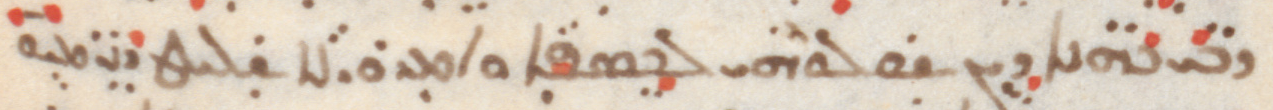ܪ̈ܒܝ ܟܗܢ̈ܐ ܕܝܢ ܫܩܠܘܗܝ ܠܟܣܦܐ ܘܐܡ̣ܪܘ. ܠܐ ܫܠܝܛ ܕܢܪ܏ܡܝܘ
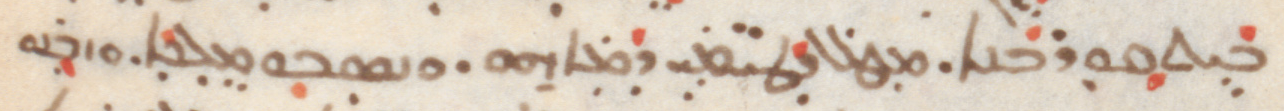ܒܝܬ ܩܘܪܒܢܐ. ܡܛܠ ܕܛܝ̈ܡܝ ܕܡܐ ܗܘ. ܘܢܣ̣ܒܘ ܡܠܟܐ. ܘܙܒܢܘ
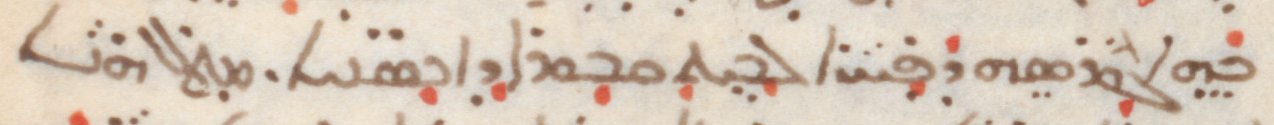ܒܗ ܐܓܘܪܣܗ ܕܦܚܪܐ ܠܒܝܬ ܩܒܘܪܐ ܕܐܟܣ̈ܢܝܐ. ܡܛܠ ܗܢܐ
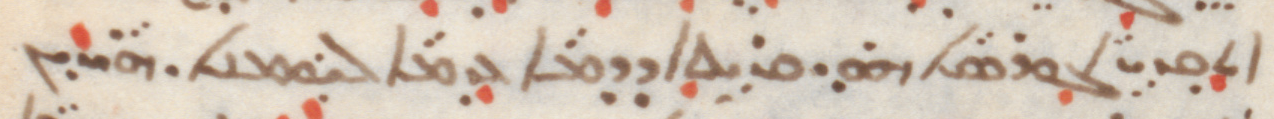ܐܬܩܪܝ ܐܓܘܪܣܐ ܗ̇ܘ܆ ܩܪܝܬܐ ܕܕܡܐ ܥܕܡܐ ܠܝܘܡܢܐ. ܗܝܕܝܢ
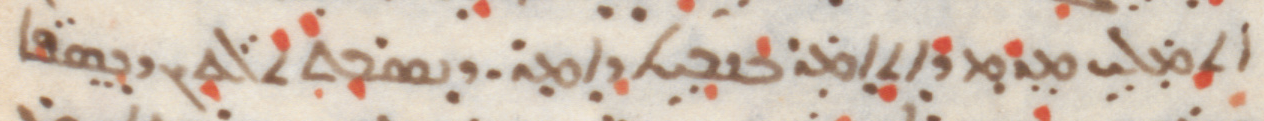ܐܬܡܠܝ ܡܕܡ ܕܐܬܐܡܪ ܒܢܒܝܐ ܕܐܡ̣ܪ. ܕܢܣܒܬ ܬܠܬܢ ܕܟܣܦܐ
